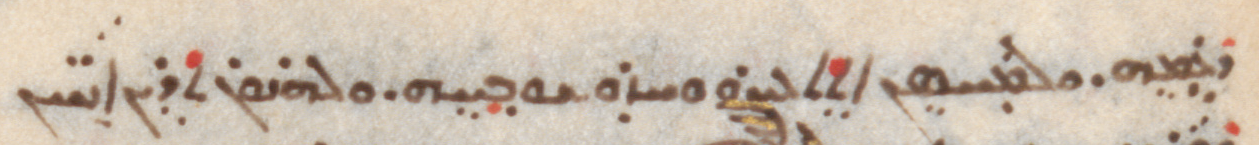ܕܥܡܗ. ܘܠܡܚܣܢ ܐܬܬܥܝܪܘ ܘܚܙܘ ܫܘܒܚܗ. ܘܠܗܢܘܢ ܬܪܝܢ ܐܢܫܝ̈ܢ
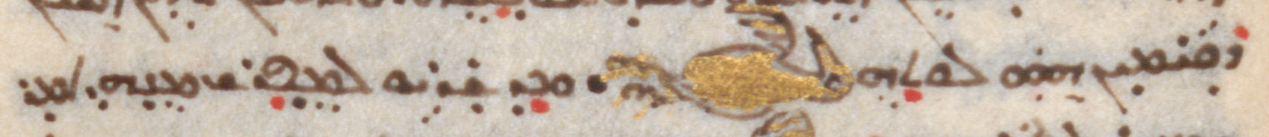ܕܩܝܡܝܢ ܗܘܘ ܠܘܬܗ ܀܀ ܘܟܕ ܫܪܝܘ ܠܡܦܪܫ ܡܢܗ܆ ܐܡ̣ܪ
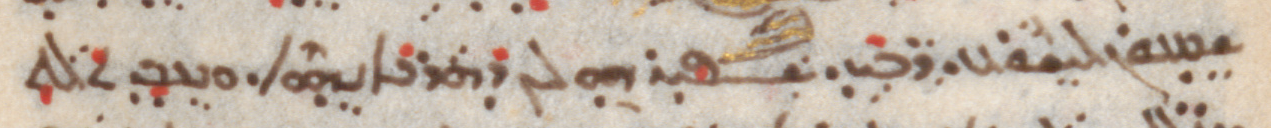ܫܡܥܘܢ ܠܝܫܘܥ. ܪܒܝ܆ ܫܦܝܪ ܗܘ ܠܢ ܕܗܪܟܐ ܢܗܘܐ. ܘܢܥܒܕ ܬܠܬ
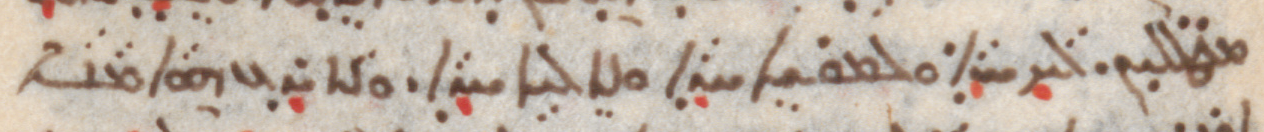ܡܛ̈ܠܝܢ. ܠܟ ܚܕܐ ܘܠܡܘܫܐ ܚܕܐ ܘܠܐܠܝܐ ܚܕܐ. ܘܠܐ ܝ̇ܕܥ ܗܘܐ ܡܢܐ
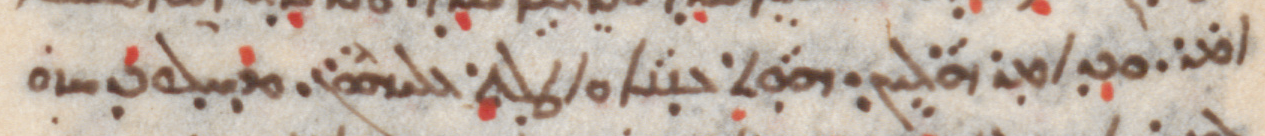ܐܡ̇ܪ. ܘܟܕ ܐܡ̣ܪ ܗܠܝܢ܆ ܗܘܬ ܥܢܢܐ ܘܐܛܠ̣ܬ ܥܠܝܗܘܢ. ܘܕܚܠ̣ܘ ܟܕ ܚܙ̣ܗ
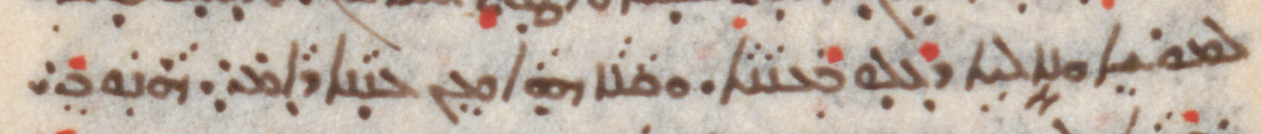ܠܡܘܫܐ ܘܠܐܠܝܐ ܕܥܠܘ ܒܥܢܢܐ. ܘܩܠܐ ܗܘܐ ܡ̣ܢ ܥܢܢܐ ܕܐܡ̇ܪ܆ ܗܢܘ ܒܪܝ
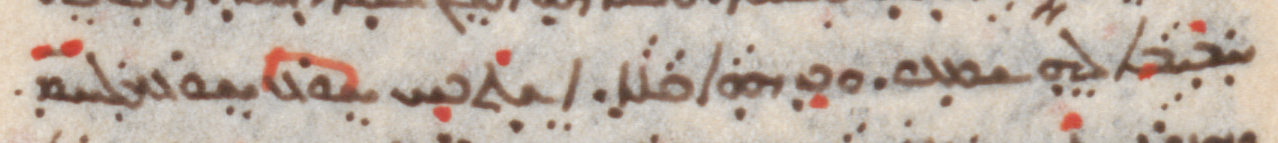ܚܒܝܒܐ ܠܗ ܫܡܥ̣ܘ. ܘܟܕ ܗܘܐ ܩܠܐ. ܐܫ̣ܬܟܚ ܝܫܘܥ ܝܫܘܥ ܒܠܚܘ܏ܕ
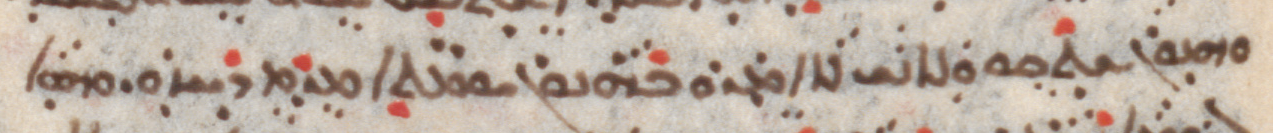ܘܗܢܘܢ ܫܬܩܘ ܘܠܐܢܫ ܠܐ ܐܡܪܘ ܒܗܢܘܢ ܝܘ̈ܡܬܐ ܡܕܡ ܕܚܙܘ. ܘܗܘܐ
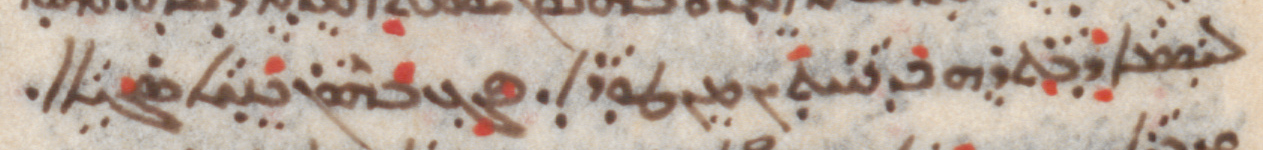ܠܝܘܡܐ ܕܒܬܪܗ ܟܕ ܢܚܬܝܢ ܡ̣ܢ ܛܘܪܐ܆ ܦܓ̣ܥ ܒܗܘܢ ܟܢܫܐ ܣܓܝܐܐ.
